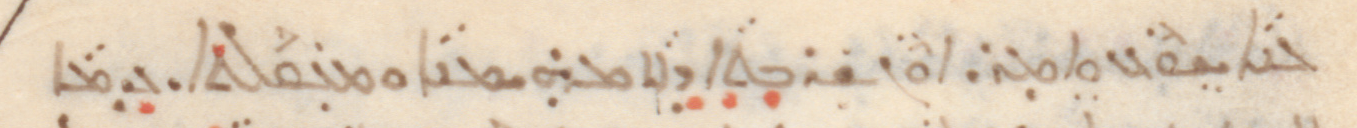ܥܢܐ ܝܫܘܥ ܘܐܡ̣ܪ. ܐܘܢ ܫܪܒܬܐ ܕܠܐ ܡܗܝܡܢܐ ܘܡܥܩܠܬܐ. ܥܕܡܐ
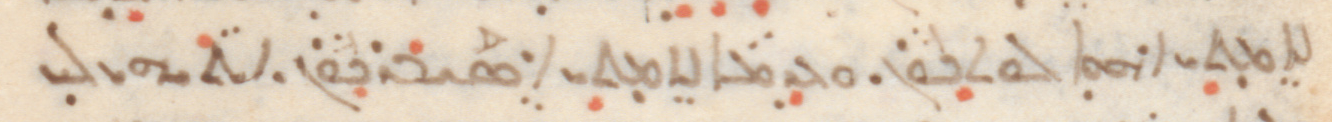ܠܐܡܬܝ ܐܗܘܐ ܠܘܬܟܘܢ. ܘܥܕܡܐ ܠܐܡܬܝ ܐܣܝܒܪܟܘܢ ܐܝܬܝܗܝ ܠܝ
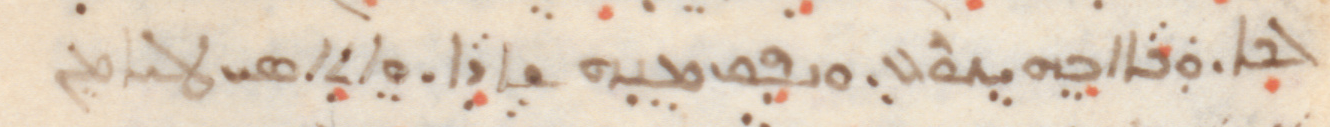ܠܟܐ. ܘܟܐܐ ܒܗ ܝܫܘܥ. ܘܢܦ̣ܩ ܡܢܗ ܫܐܕܐ. ܘܐܬܐܣܝ ܛܠܝܐ ܡܢ
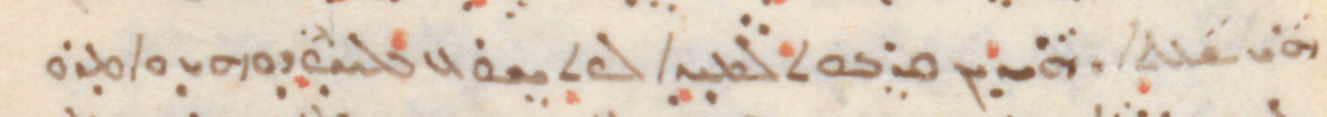ܗ̇ܝ ܫܥܬܐ. ܗܝܕܝܢ ܩܪܒܘ ܬܠ̈ܡܝܕܐ ܠܘܬ ܝܫܘܥ ܒܠܚܘ̈ܕܘܗܝ ܘܐܡ̣ܪܘ
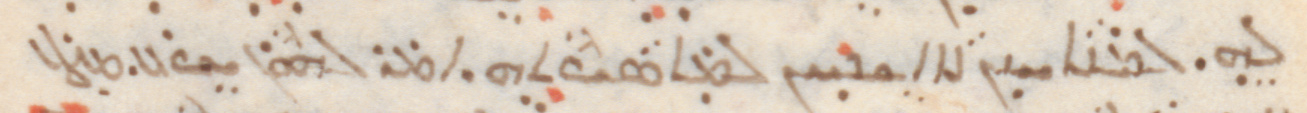ܠܗ. ܠܡܢܐ ܚܢܢ ܠܐ ܐܫܟ̣ܚܢ ܠܡܐܣܝܘܬܗ. ܐܡ̇ܪ ܠܗܘܢ ܝܫܘܥ: ܡܛܠ
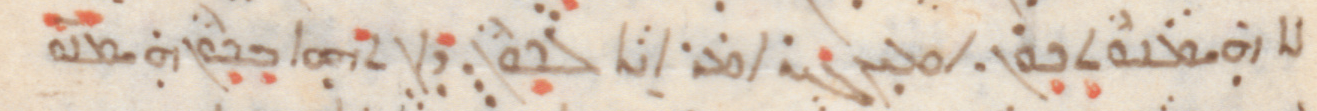ܠܐ ܗܝܡܢܘܬܟܘܢ: ܐܡܝܢ ܓܝܪ ܐܡ̇ܪ ܐܢܐ ܠܟܘܢ: ܕܐܢ ܬܗܘܐ ܒܟܘܢ ܗ܏ܝܡܢܘ
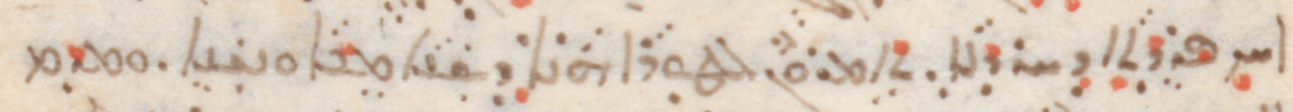ܐܝܟ ܦܪܕܬܐ ܕܚܪܕܠܐ. ܬܐܡܪܘܢ ܠܛܘܪܐ ܗܢܐ ܕܫܢܐ ܡܟܐ ܘܢܫܢܐ. ܘܡܕܡ
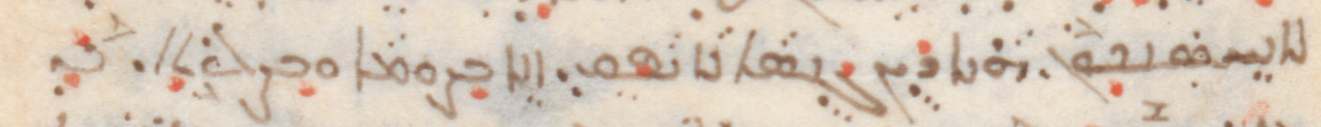ܠܐ ܢܚܣܢܟܘܢ. ܗܢܐ ܕܝܢ ܓܢܣܐ ܠܐ ܢܦܩ܆ ܐܠܐ ܒܨܘܡܐ ܘܒܨܠܘܬܐ. ܟܕ
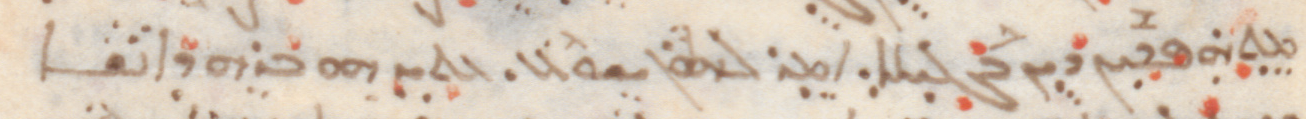ܡܬܗܦܟܝܢ ܕܝܢ ܒܓܠܝܠܐ: ܐܡ̣ܪ ܠܗܘܢ ܝܫܘܥ. ܥܬܝܢ ܗܘ ܒܪܗ ܕܐܢܫܐ
